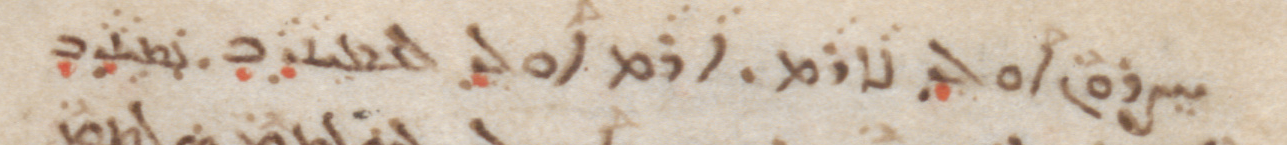ܚܨܪܘܢ ܐܘܠܕ ܠܐܪܡ. ܐܪܡ ܐܘܠܕ ܠܥܡܝܢܕܒ. ܥܡܝܢܕܒ
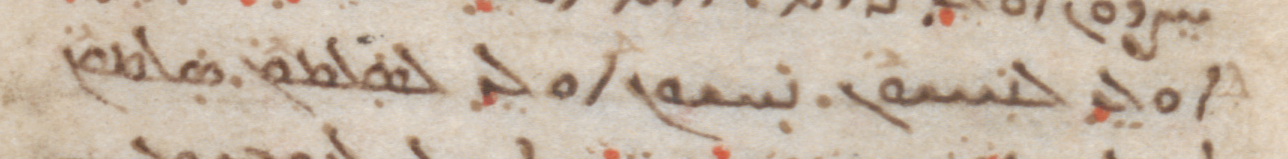ܐܘܠܕ ܠܢܚܫܘܢ. ܢܚܫܘܢ ܐܘܠܕ ܠܣܠܡܘܢ. ܣܠܡܘܢ
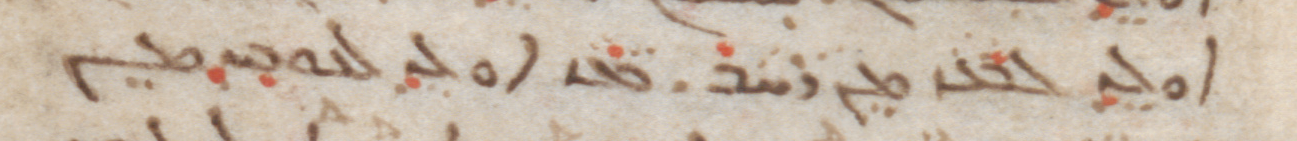ܐܘܠܕ ܠܒܥܙ ܡ̣ܢ ܪܚܒ. ܒܥܙ ܐܘܠܕ ܠܥܘܒܝܕ ܡ̣ܢ
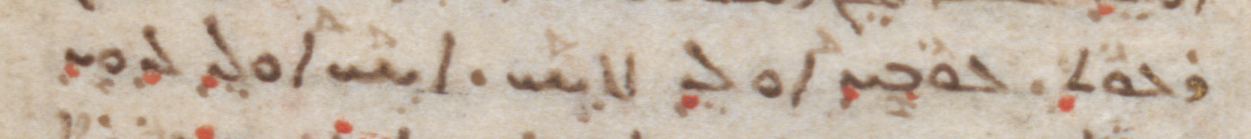ܪܥܘܬ. ܥܘܒܝܕ ܐܘܠܕ ܠܐܝܫܝ. ܐܝܫܝ ܐܘܠܕ ܠܕܘܝܕ
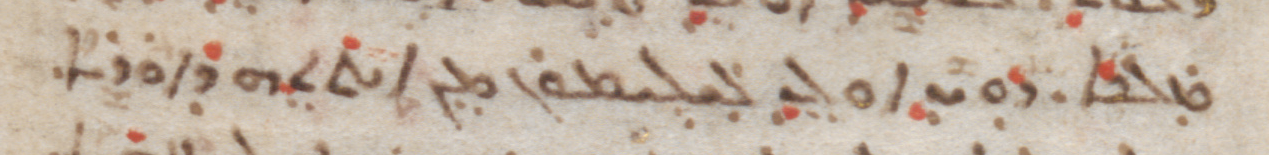ܡܠܟܐ. ܕܘܝܕ ܐܘܠܕ ܠܫܠܝܡܘܢ ܡ̣ܢ ܐܢܬܬܗ ܕܐܘܪܝܐ
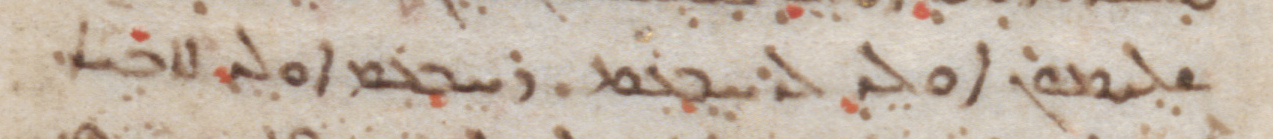ܫܠܝܡܘܢ ܐܘܠܕ ܠܪܚܒܥܡ. ܪܚܒܥܡ ܐܘܠܕ ܠܐܒܝܐ
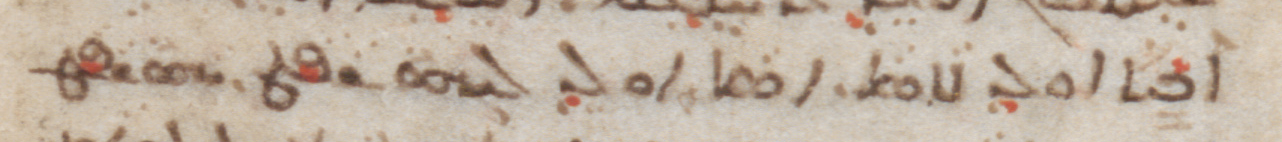ܐܒܝܐ ܐܘܠܕ ܠܐܣܐ. ܐܣܐ ܐܘܠܕ ܠܝܗܘܫܦܛ ܝܗܘܫܦܛ
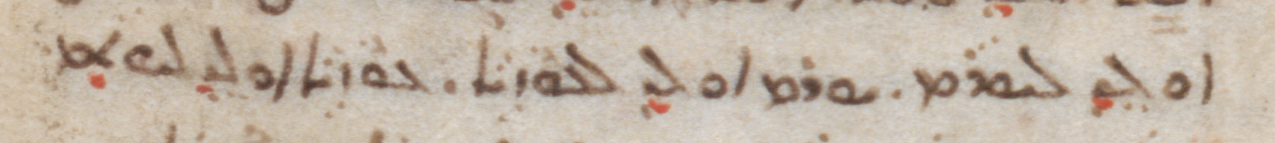ܐܘܠܕ ܠܝܘܪܡ. ܝܘܪܡ ܐܘܠܕ ܠܥܘܙܝܐ. ܥܘܙܝܐ ܐܘܠܕ ܠܝܘܬܡ
